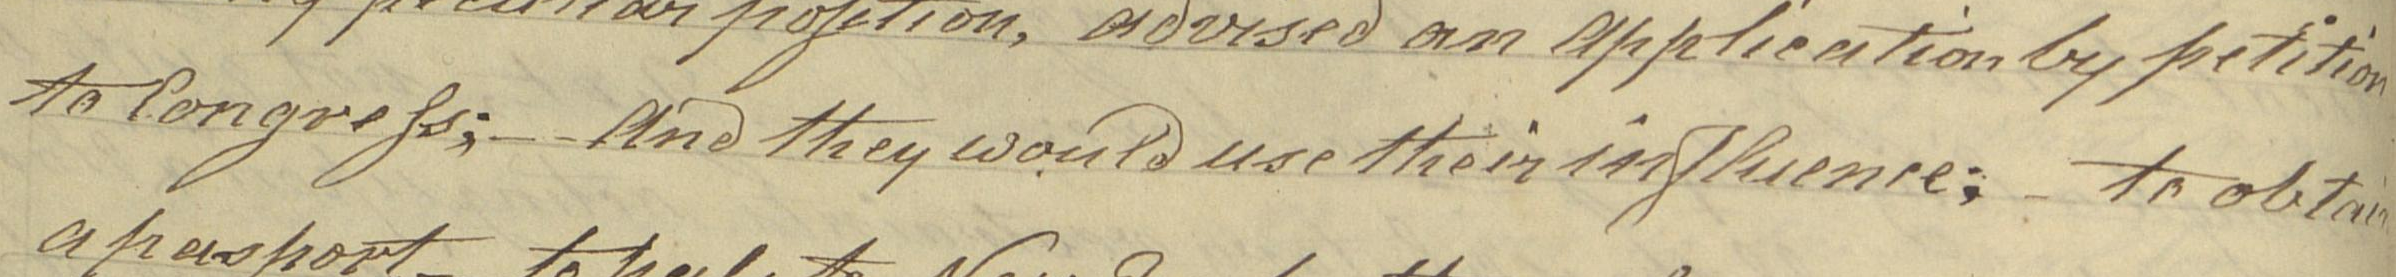to Congress; and they would use their influence; to obtain
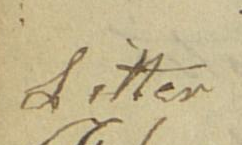Litter
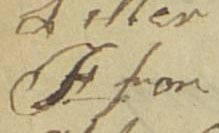F for
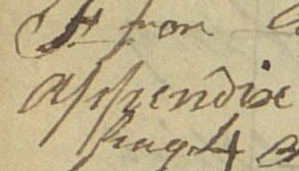Appendix
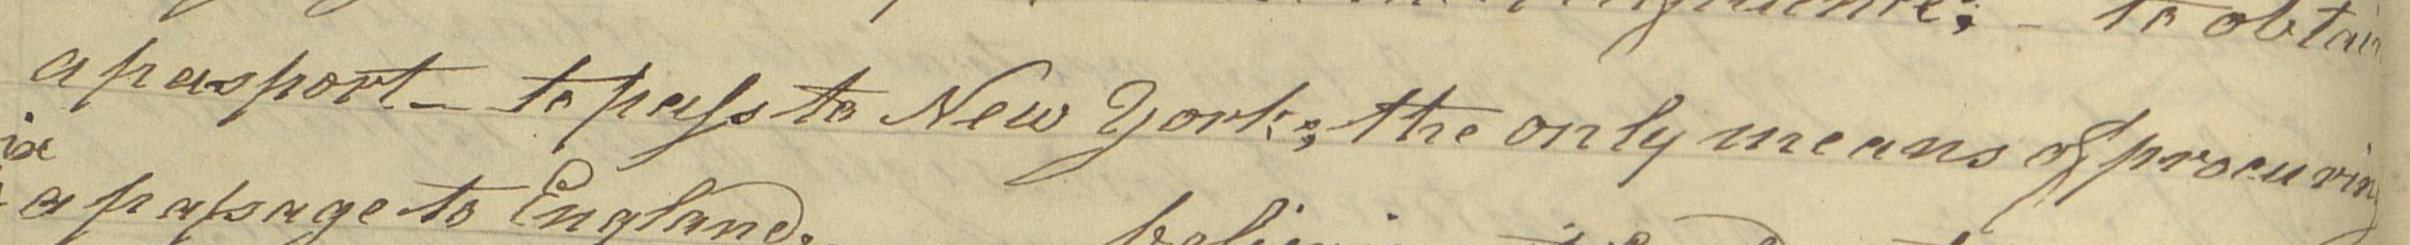a pasport, to pass to New York; the only means of procuring
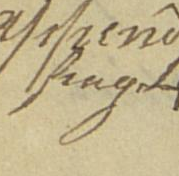page 4
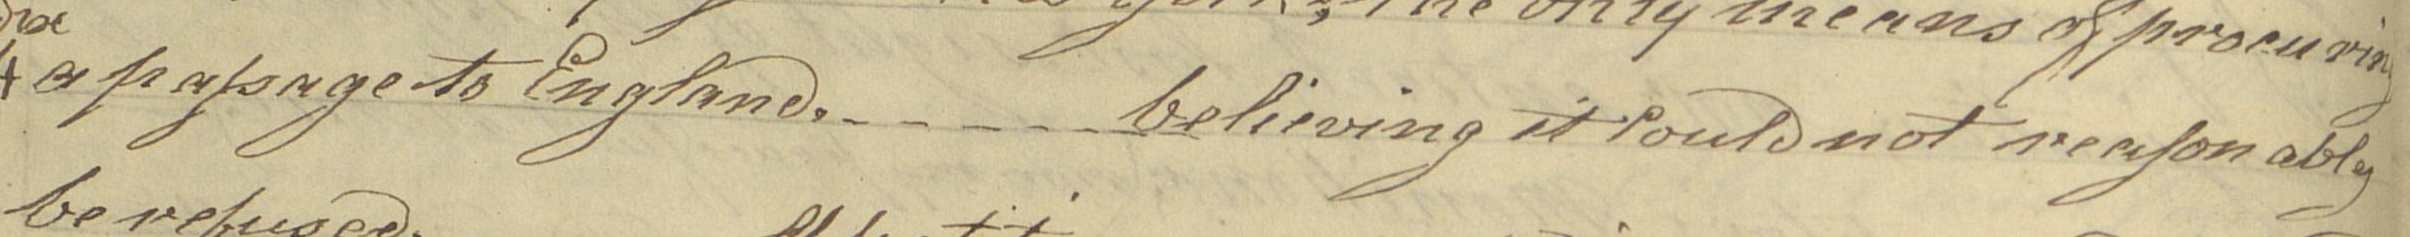a passage to England. believing it Could not reasonably
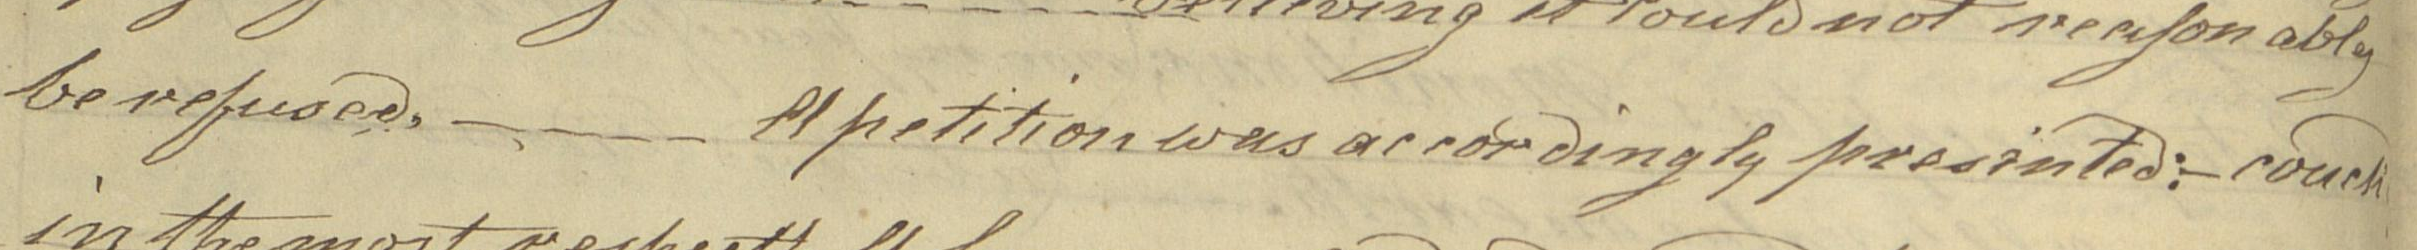be refused. A petition was accordingly presented; couch-
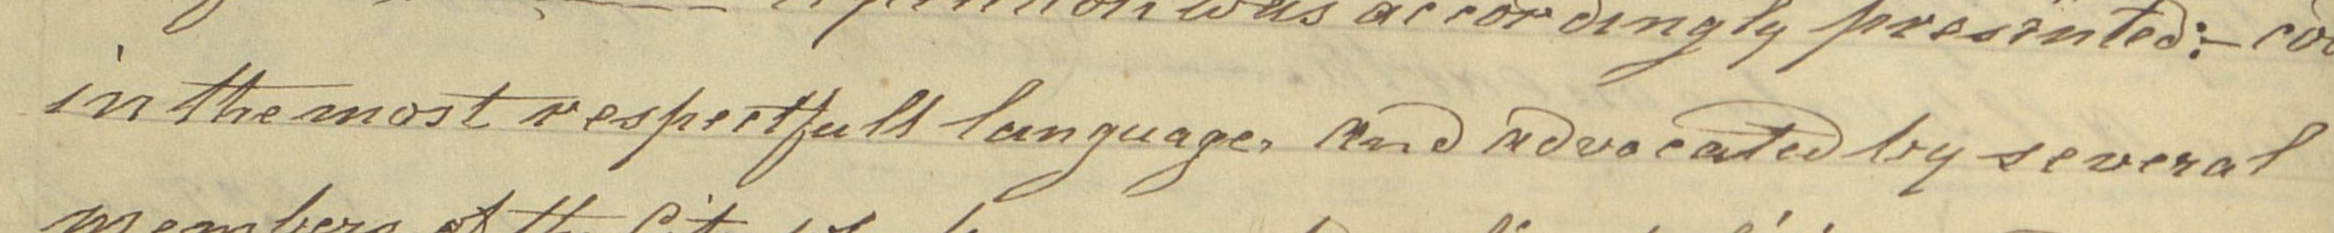in the most respectfull language and advocated by several
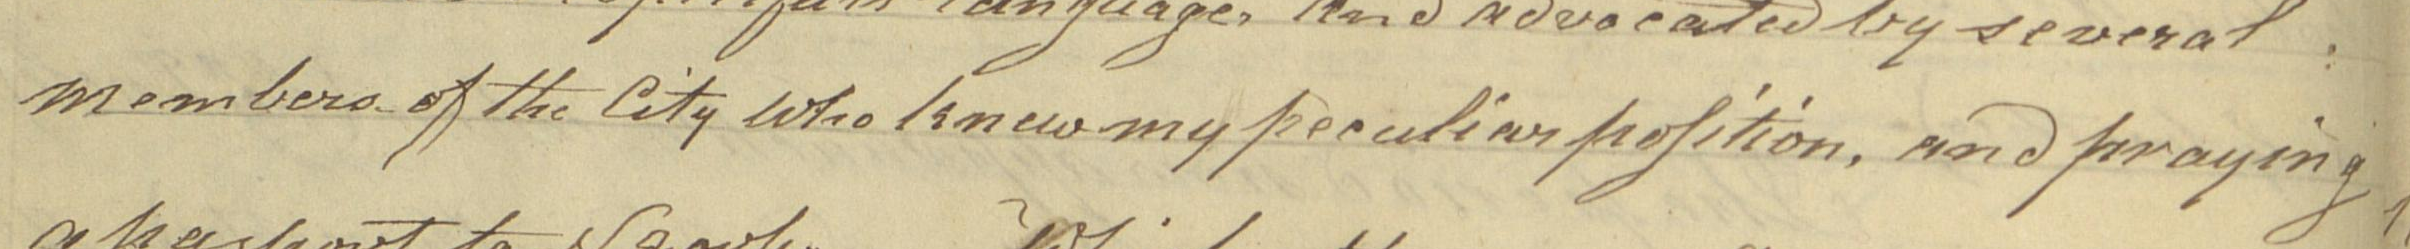members of the City who knew my peculiar position, and praying
